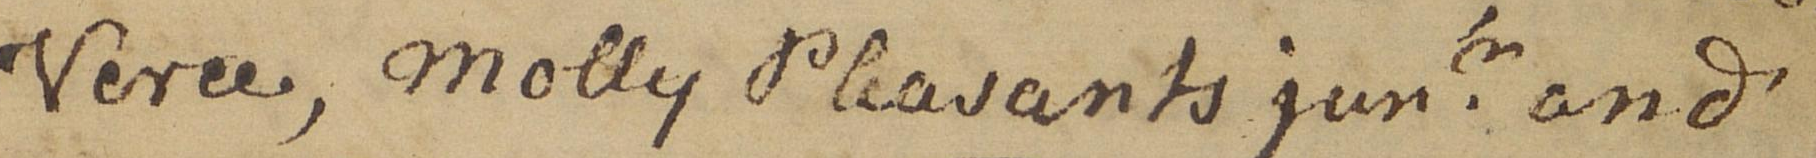Veree, Molly Pleasants jun^r. and
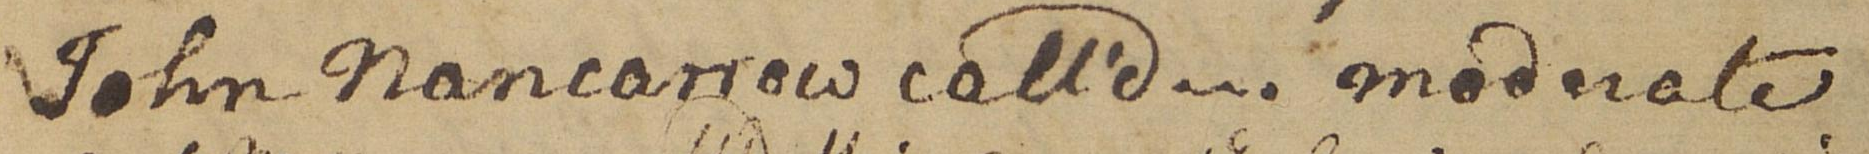John Nancarrow call'd- moderate
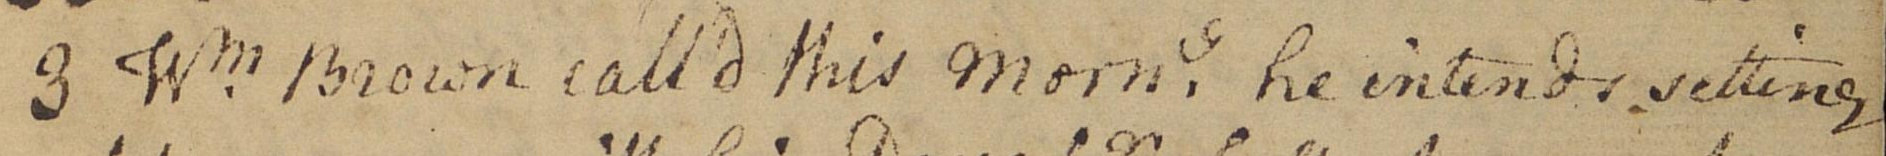3 W^m. Brown call'd this Morn.^g he intends setting
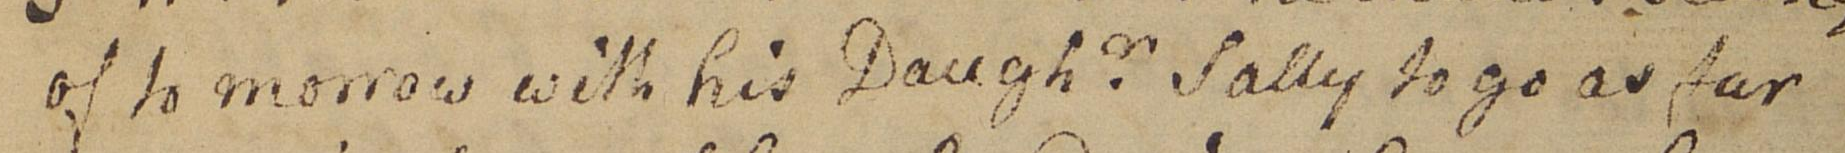of to morrow with his Daugh^r. Sally to go as far
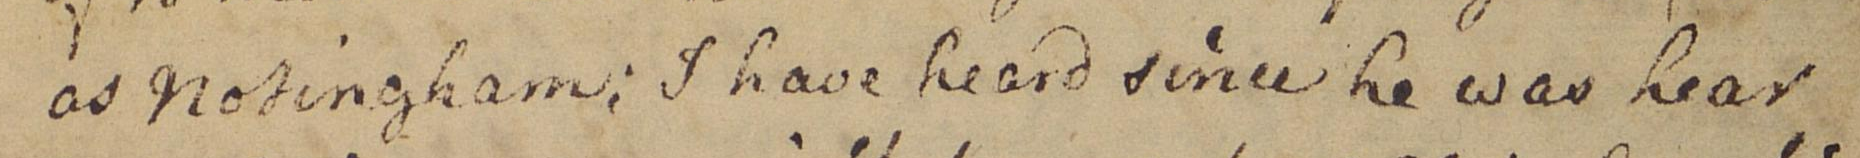as Notingham; I have heard since he was hear
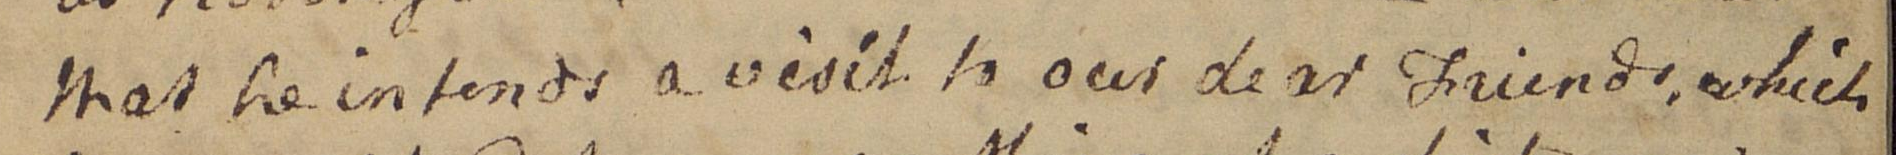that he intends a visit to our dear Friends, which
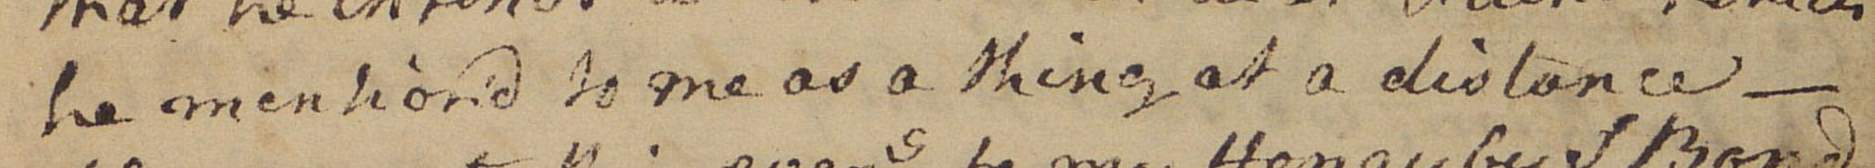he mentioned to me as a thing at a distance-
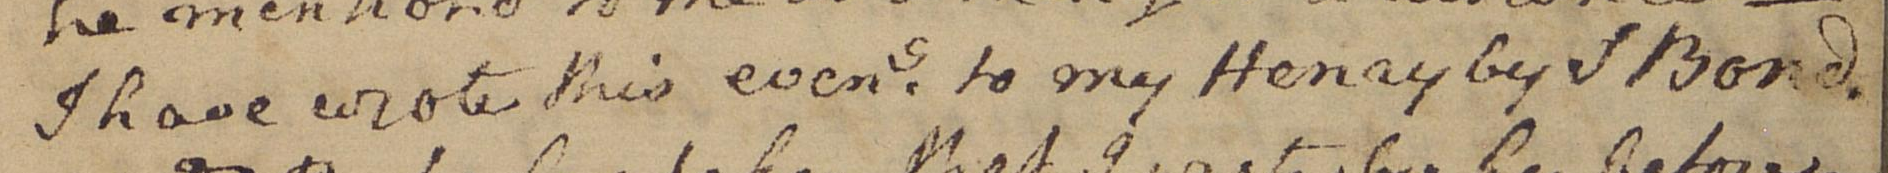I have wrote this even^g. to my Henry by S Bond.
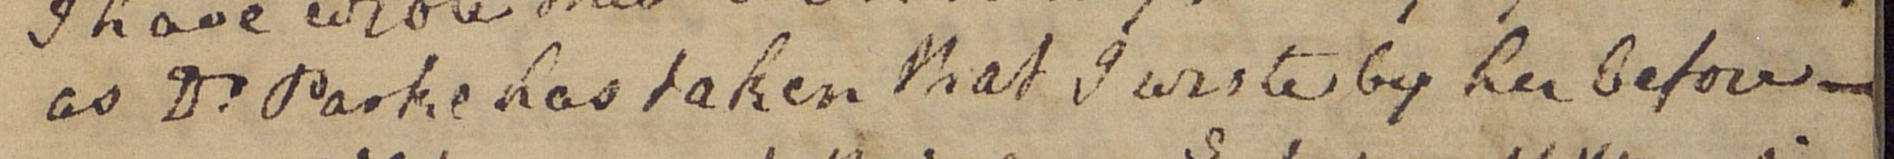as D^r. Parke has taken that I write by her before-
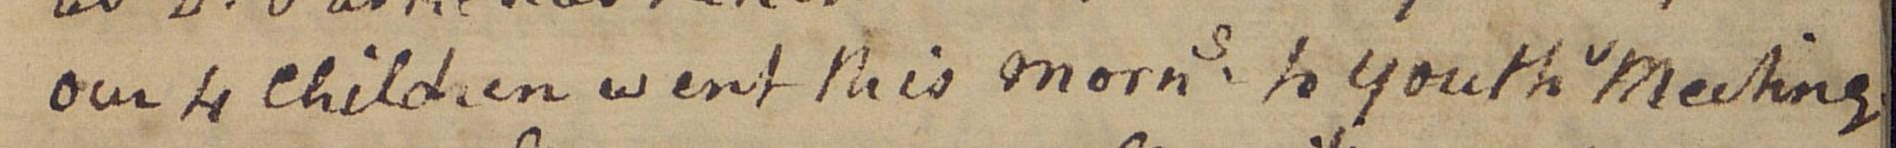our 4 Children went this Morn^g. to youth^s Meeting,
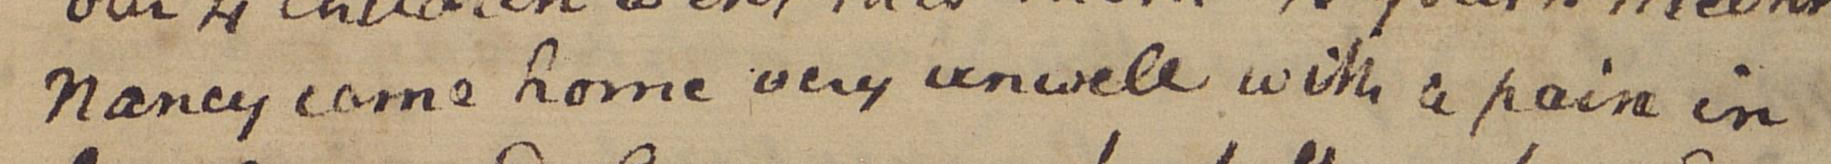Nancy came home very unwell with a pain in
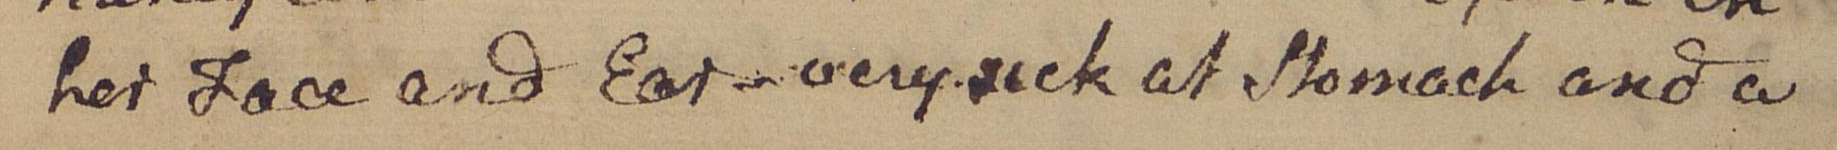her Face and Ear- very sick at Stomach and a
